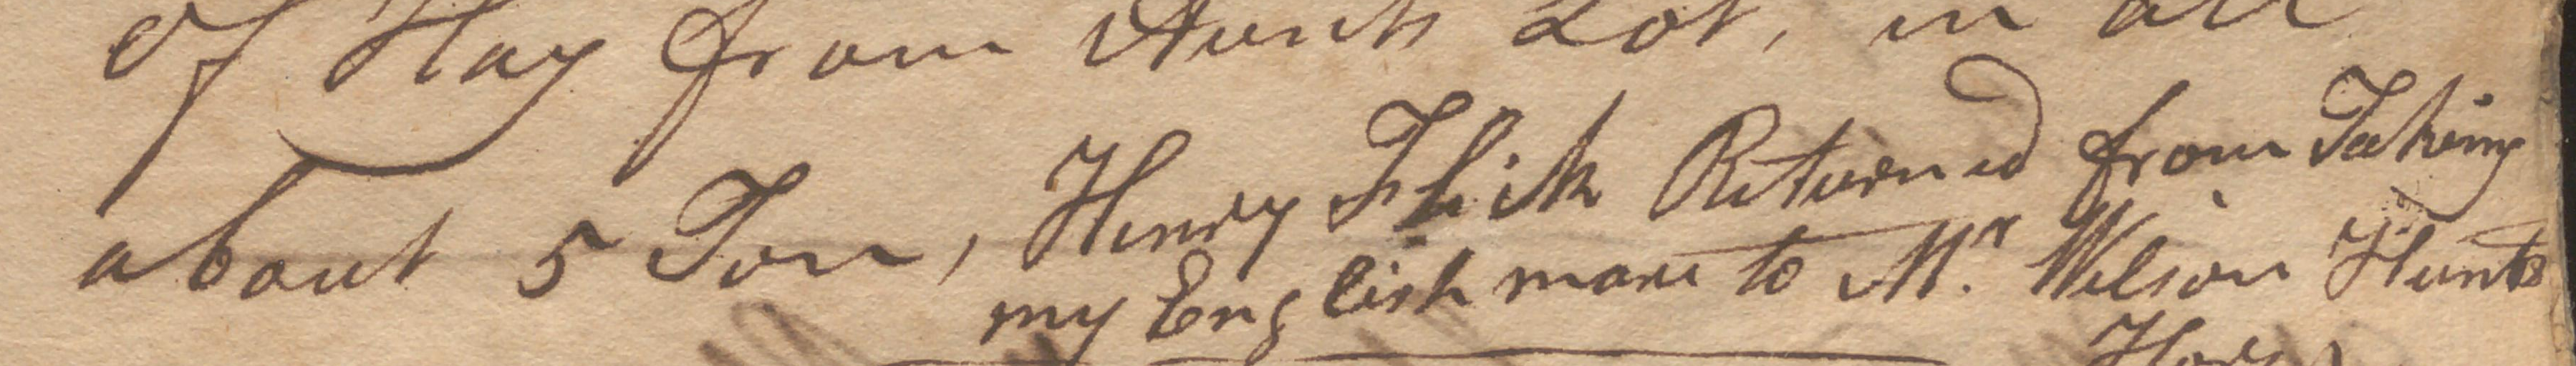about 5 Ton, Henry Flick Retuned from Taking
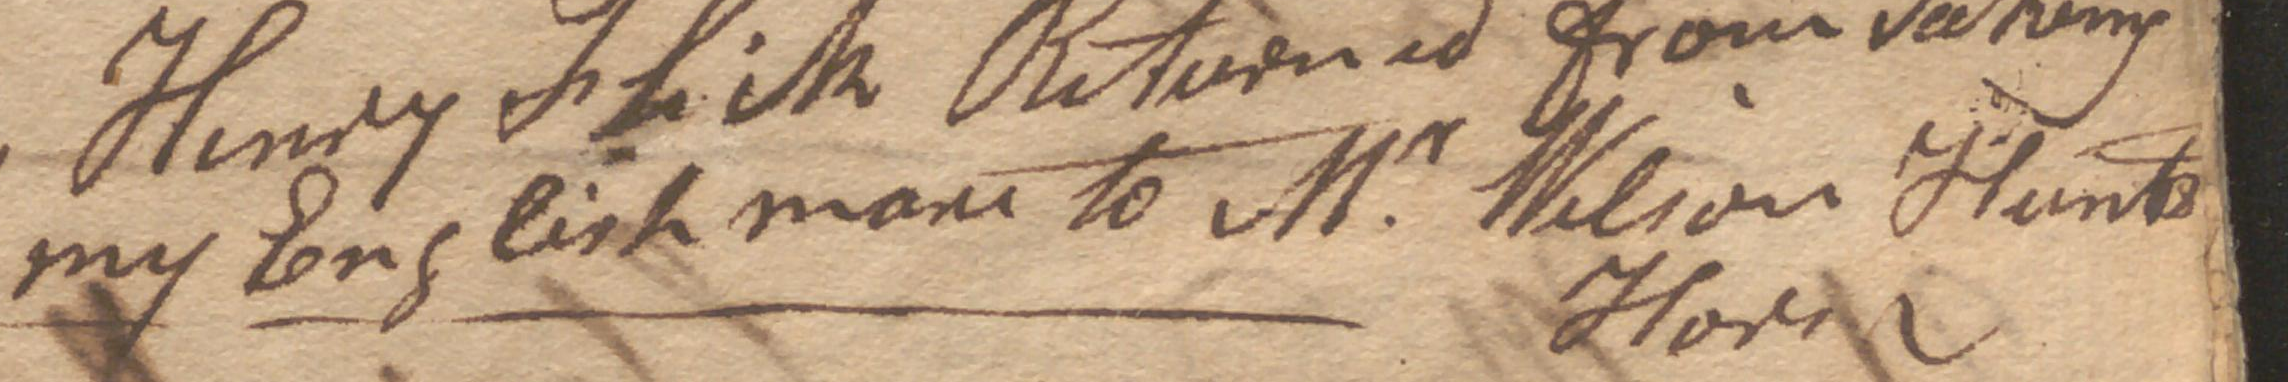my English man to M^r. Wilson Hunts
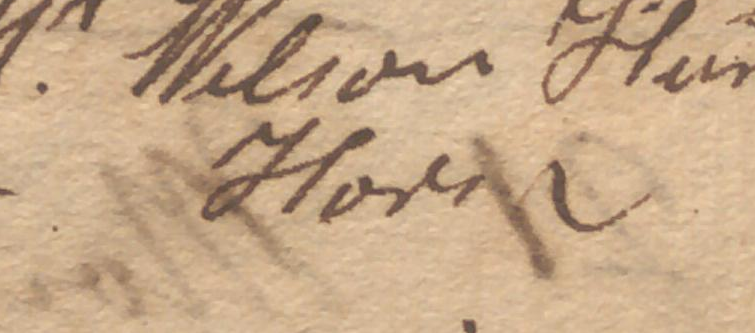Horse-
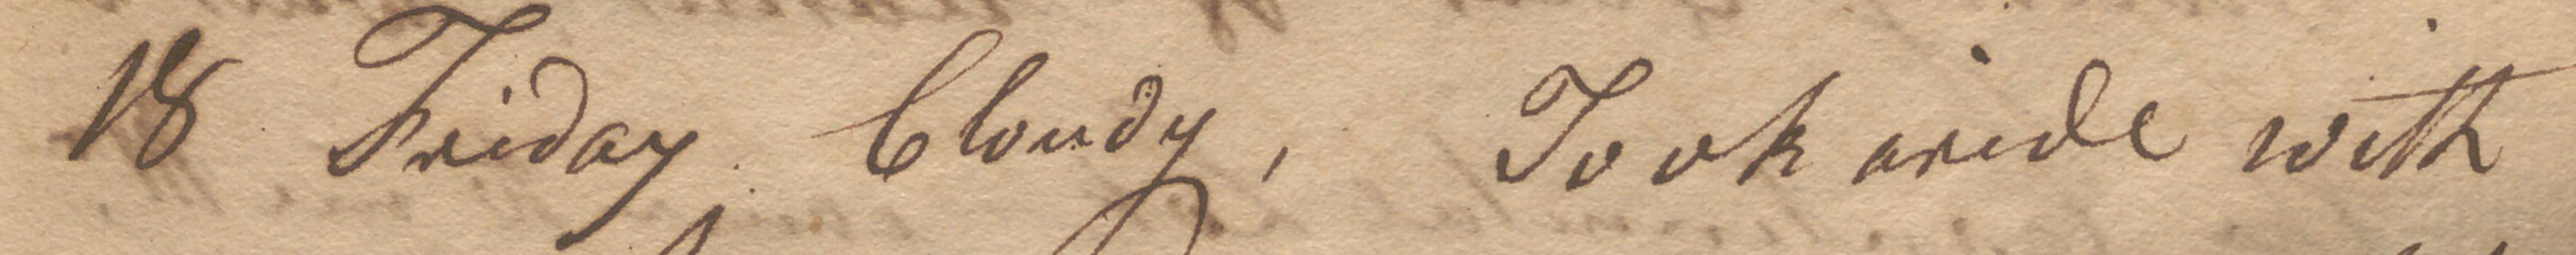18 Friday Cloudy, Took a ride with
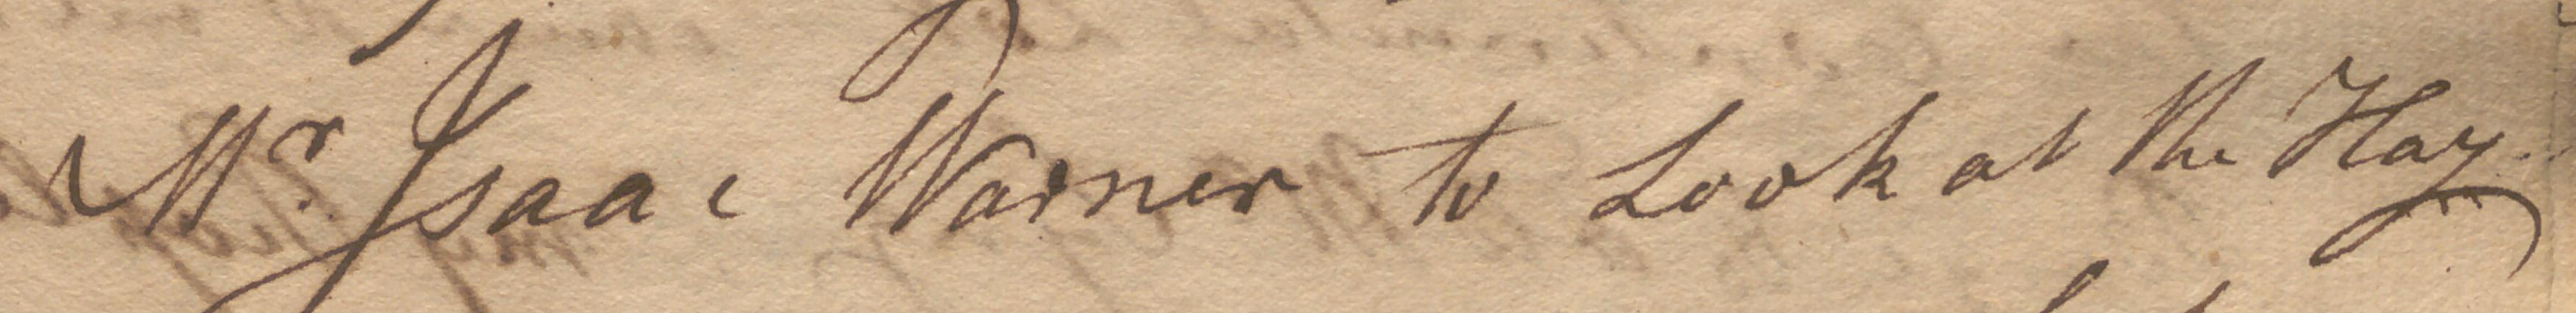M^r. Isaac Warner to Look at the Hay
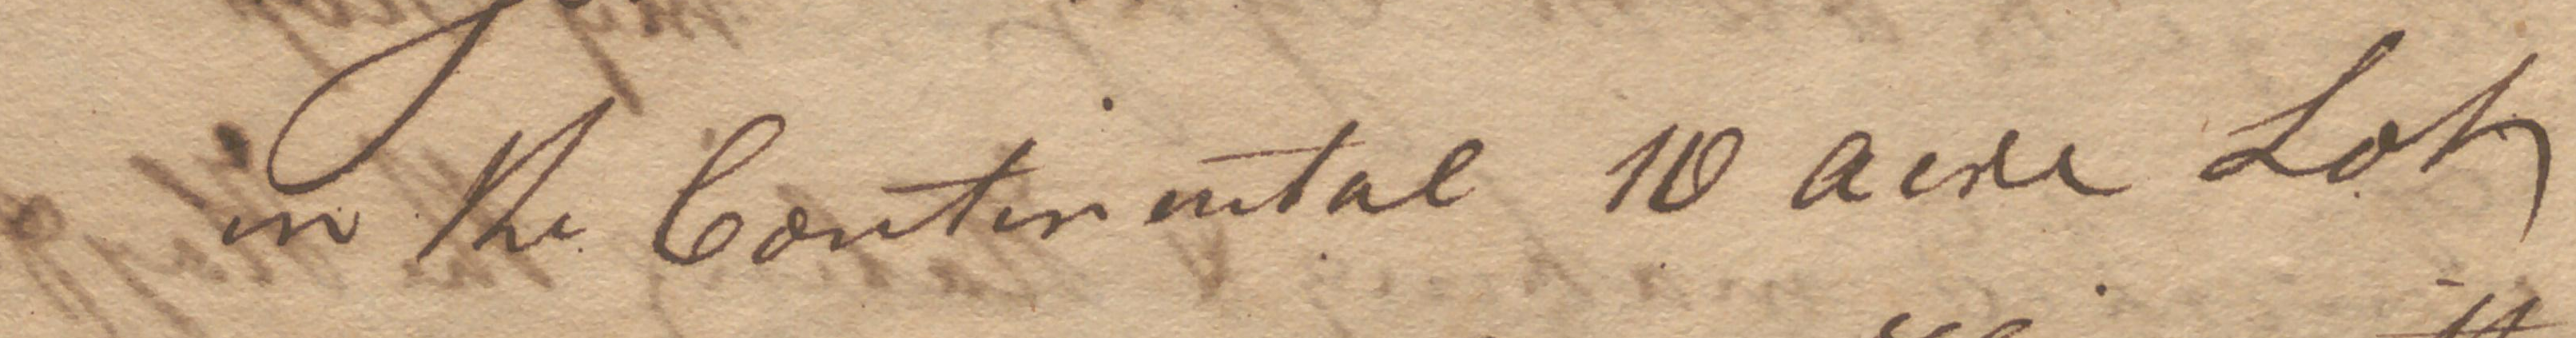in the Continental 10 acre Lot
